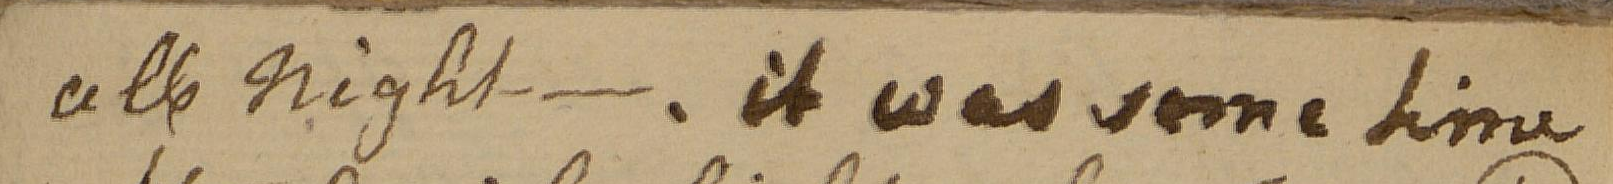all night--. it was some time
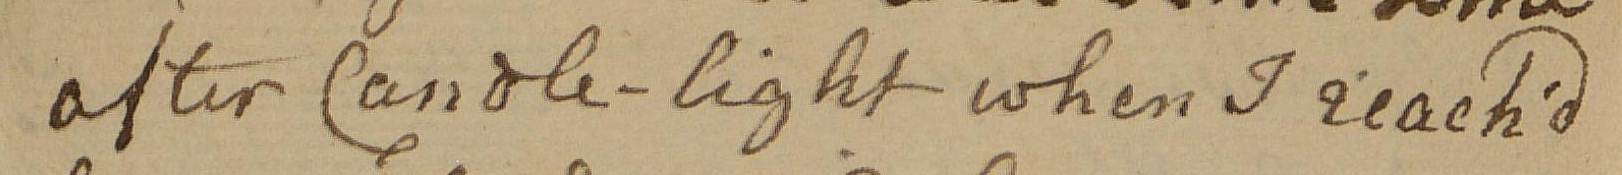after Candle-light when I reach'd
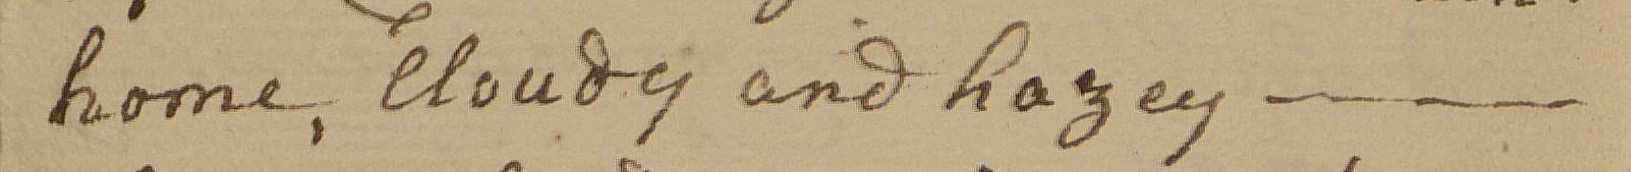home, Cloudy and hazey--
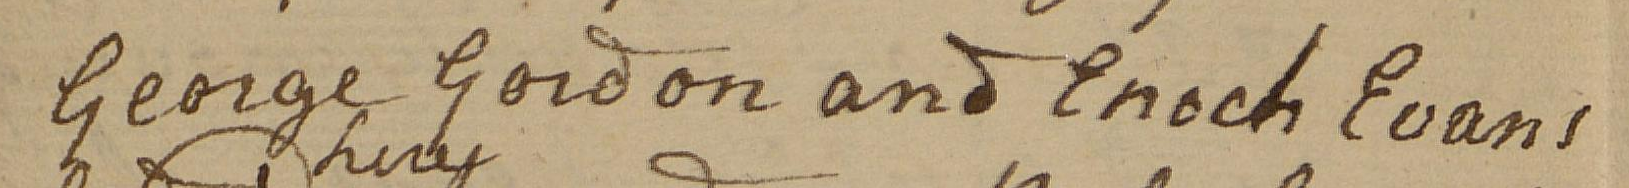George Gordon and Enoch Evans
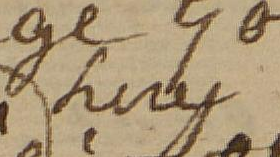here
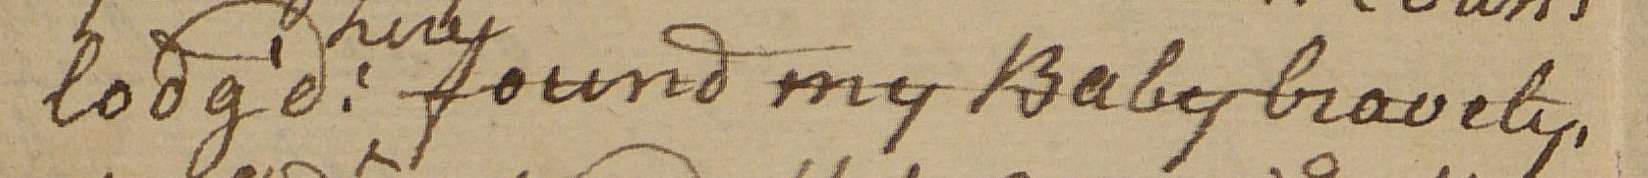lodg'd: found my Baby bravely,
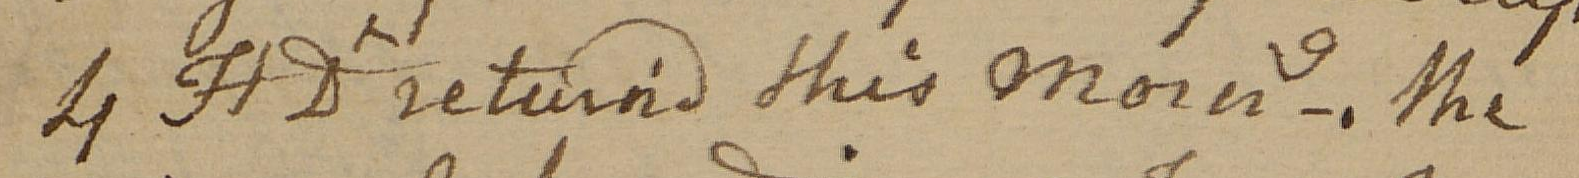4 HD return'd this morn^g-. the
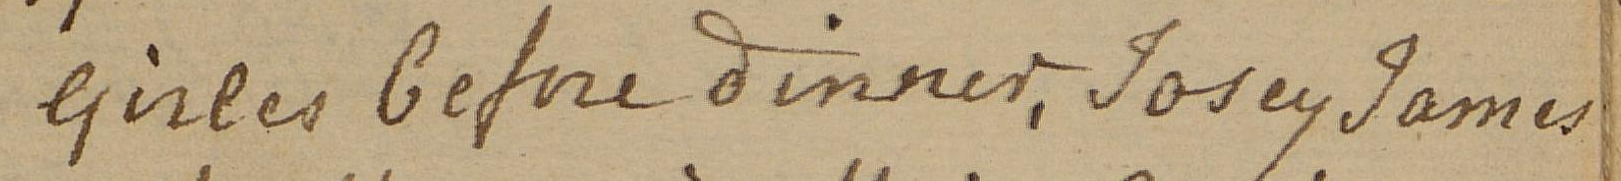Girles before dinner, Josey James
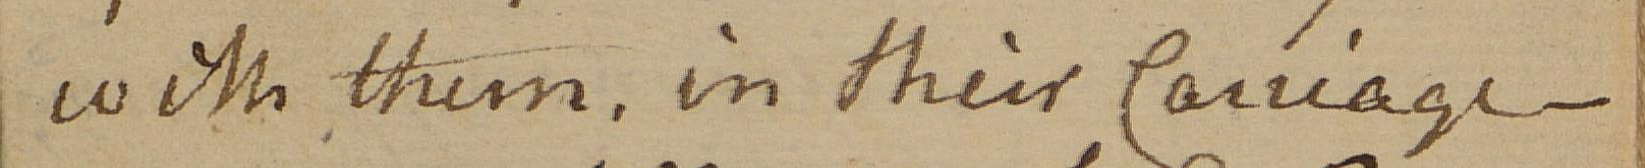with them, in their Carriage-
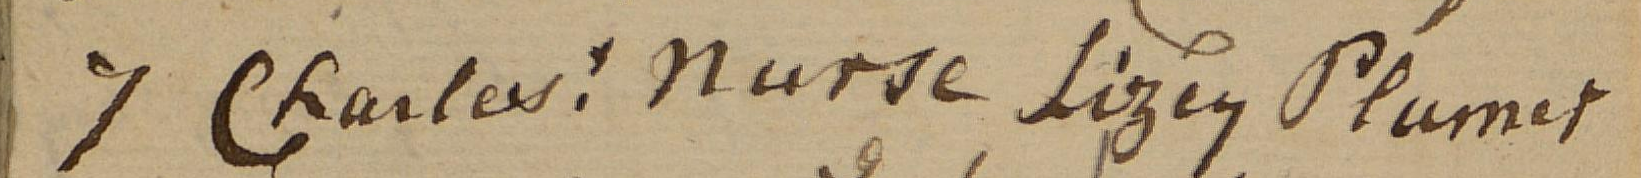7 Charles^s. Nurse Lizey Plumes
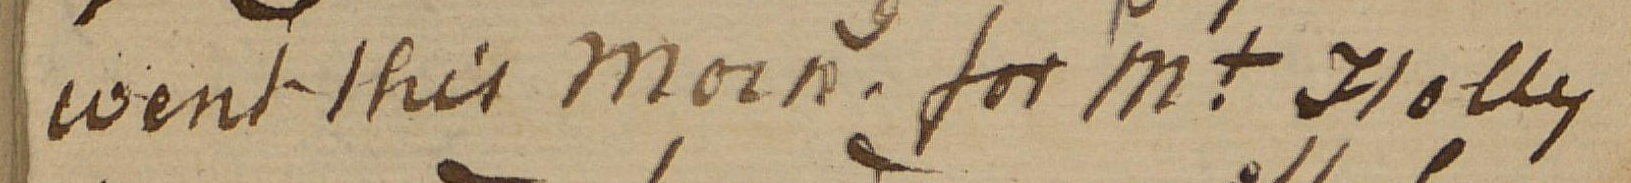went this morn^g. for Mt Holly
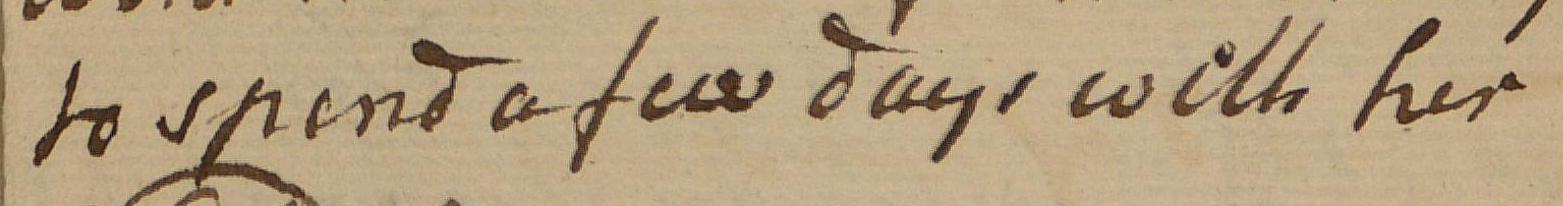to spend a few days with her
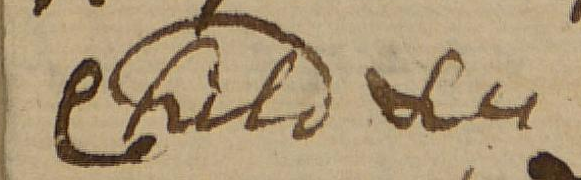Child &c -
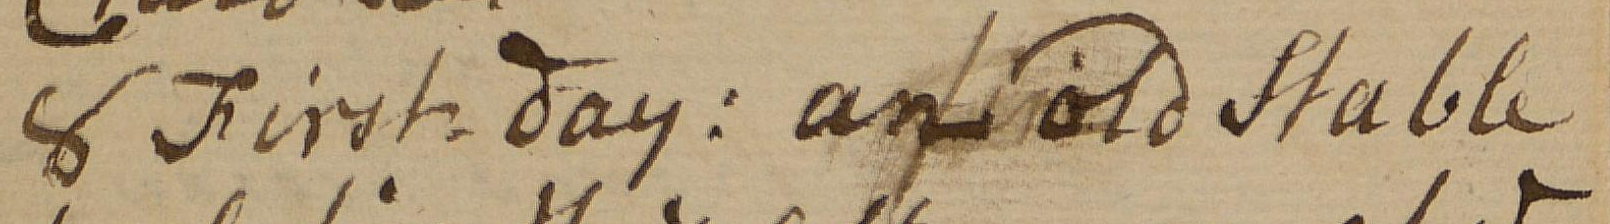8 First day: an old Stable
